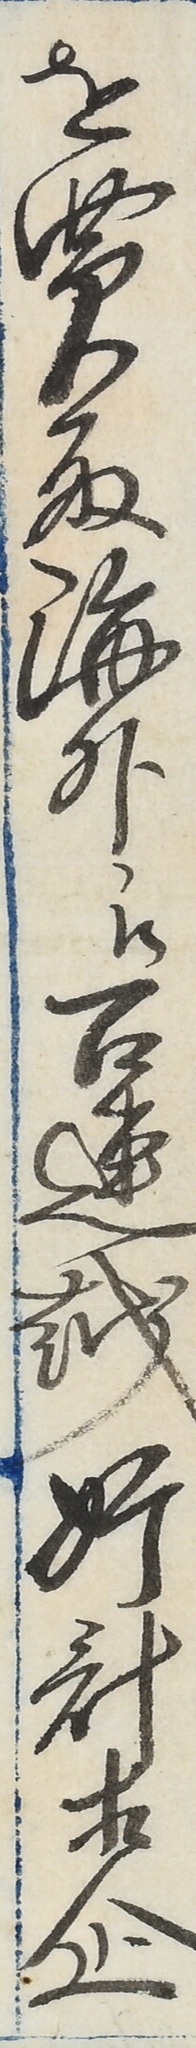を買取海外江召連越奸計相企

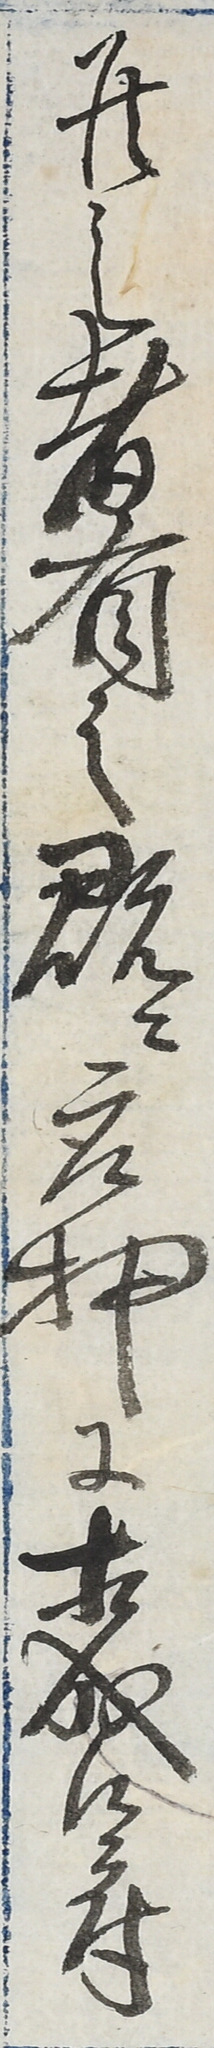候之者有之既ニ取押に相成候ニ付
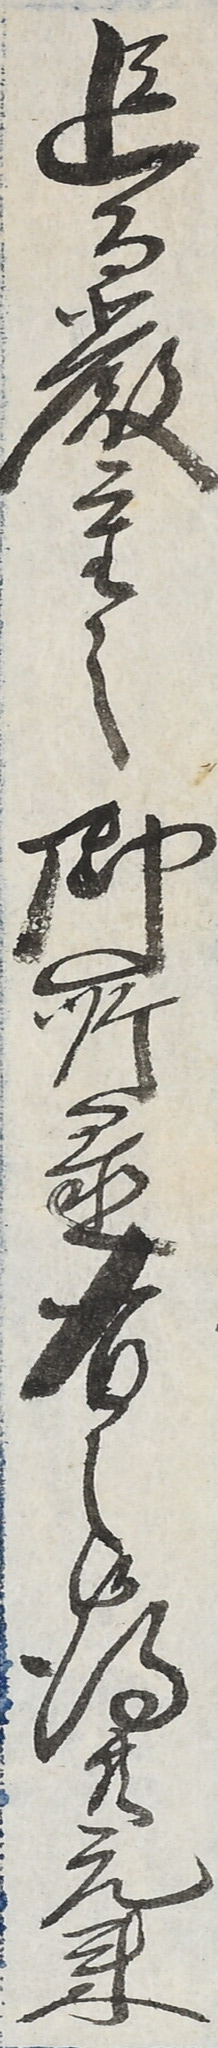追而厳重之御所置有之候得共元来
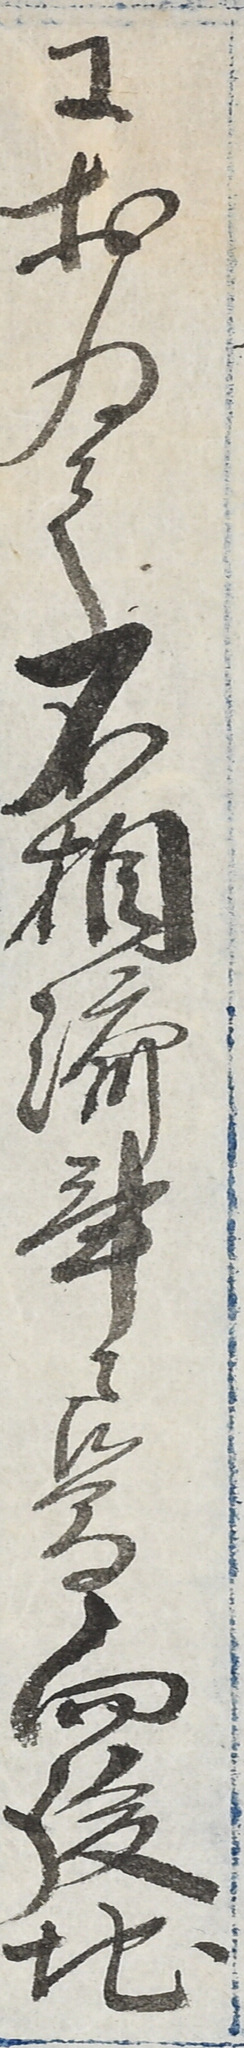におゐて不相済事ニ候間向後地
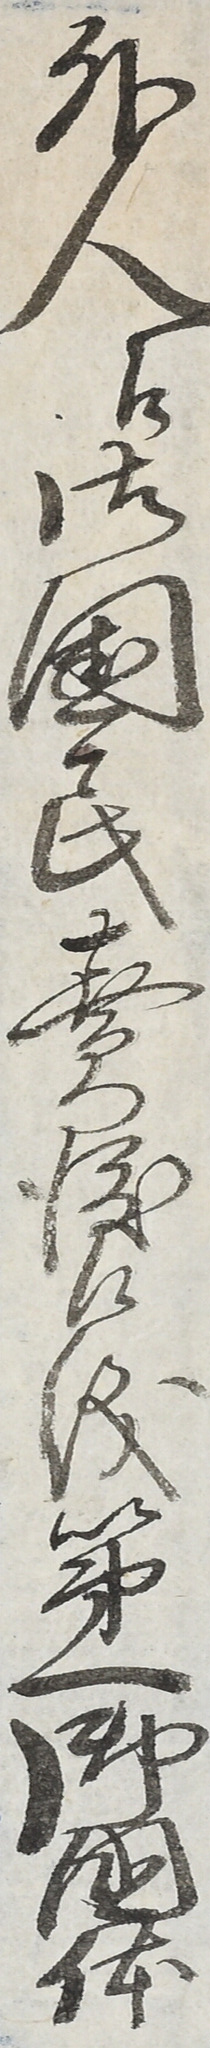外人江御国民売渡候儀第一御国体
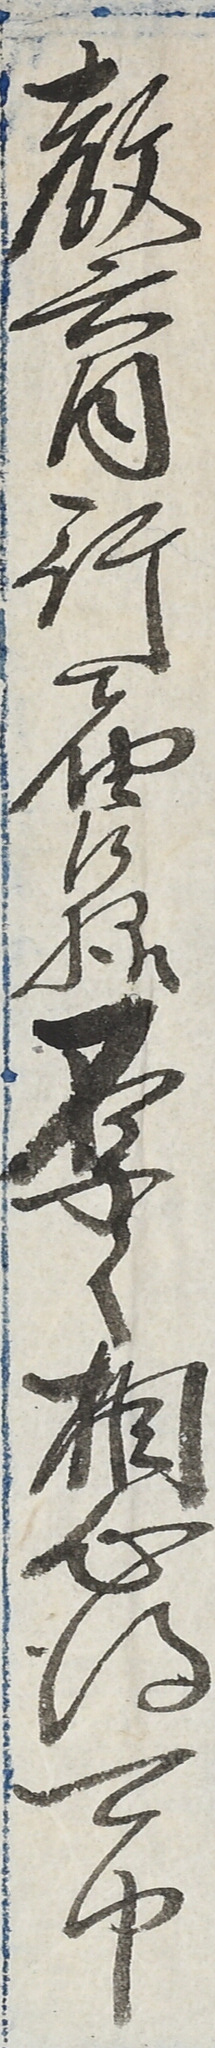教育行届候様厚く相心得可申
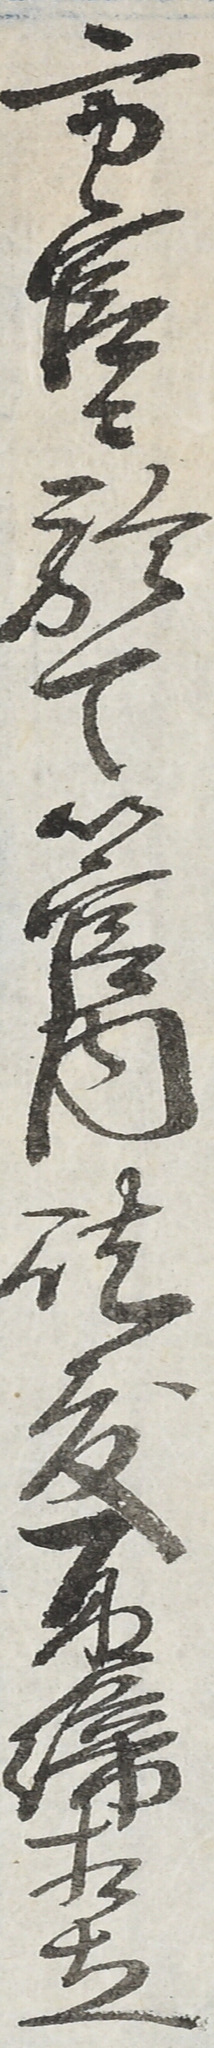方官ニ於て管内屹度取締相立
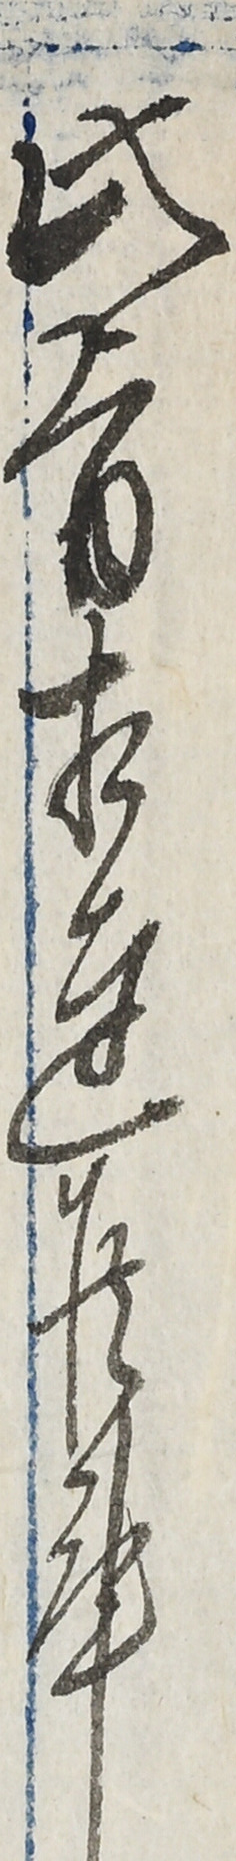此旨相達候事
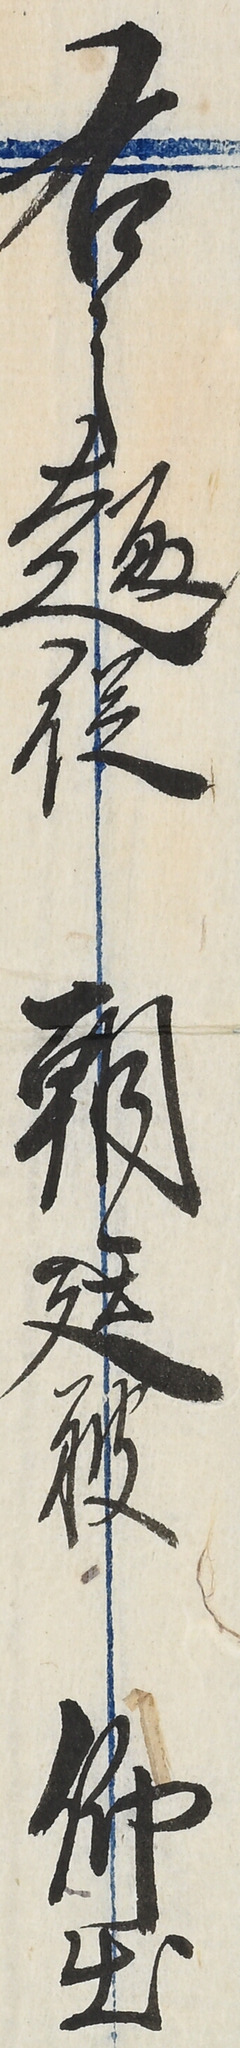右之趣従朝廷被仰出
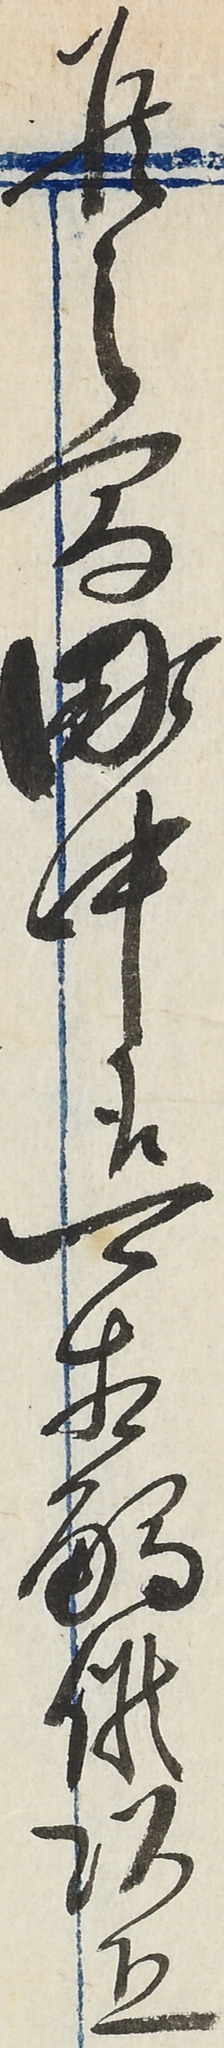候之間町中江可相触候以上

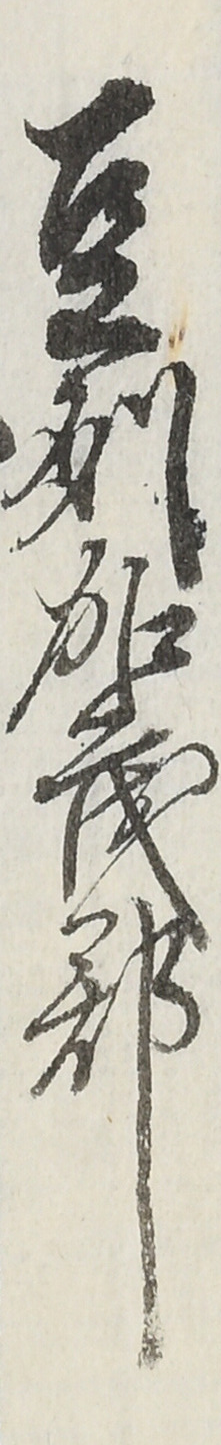豆州加茂郡
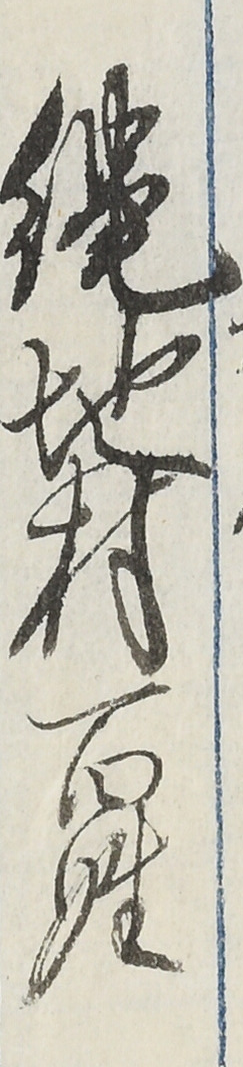縄地村百姓
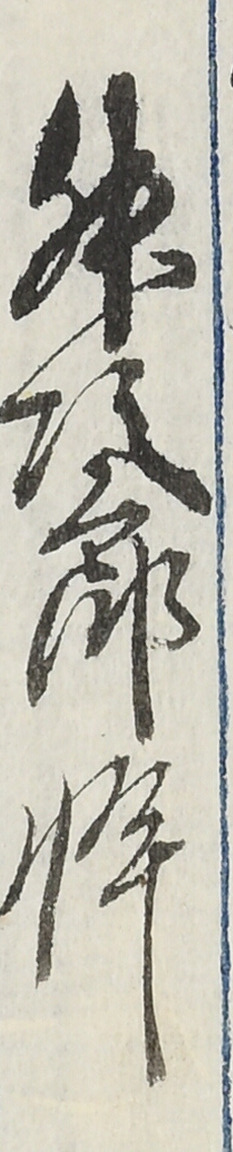升次郎倅
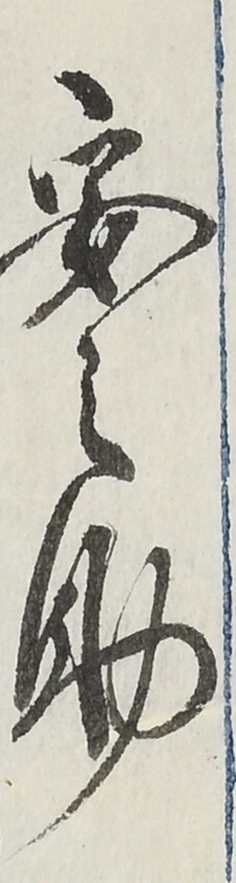安之助
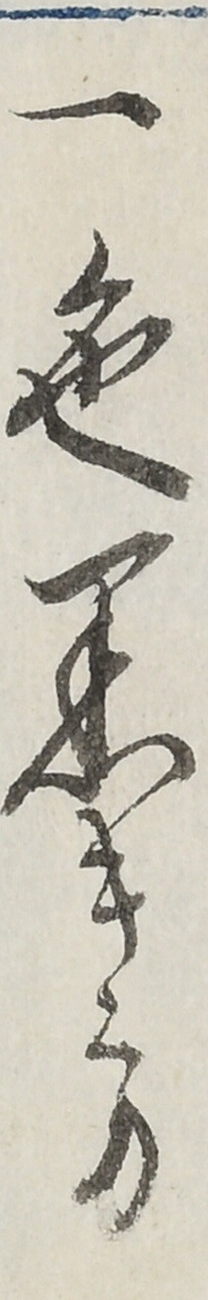一顔丸キ方
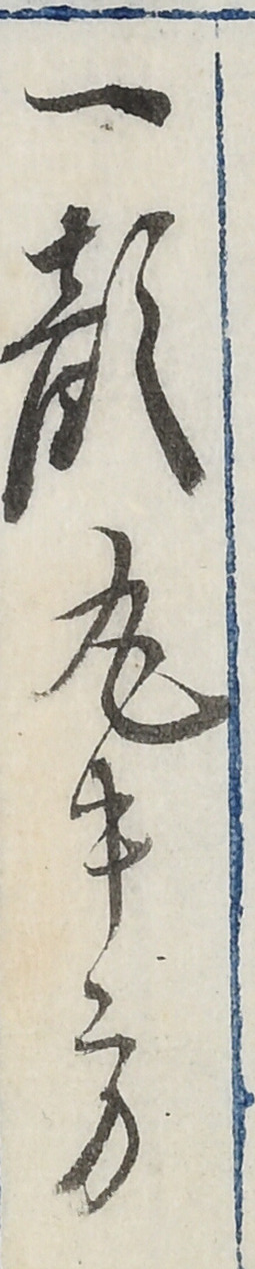一顔丸キ方
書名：布達書留
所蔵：伊那市立高遠町図書館・合同会社AMANE
